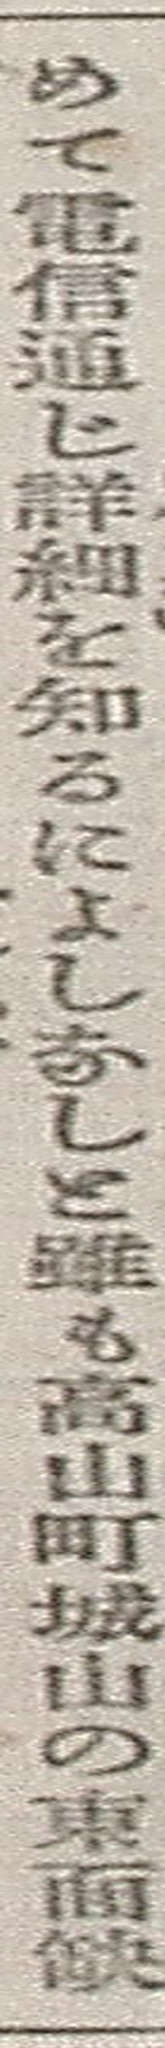めて電信通じ詳細を知るによしなしと雖も高山町城山の東面缺
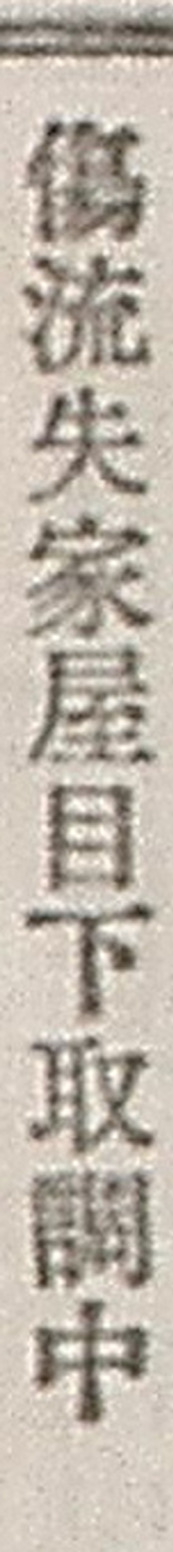傷流失家屋目下取調中
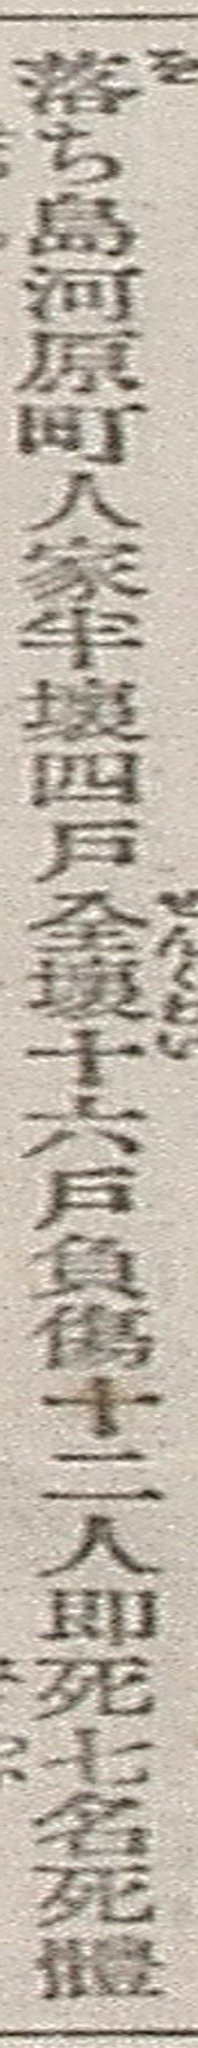落ち島河原町人家半壊四戸全壊十六戸負傷十二人即死七名死体
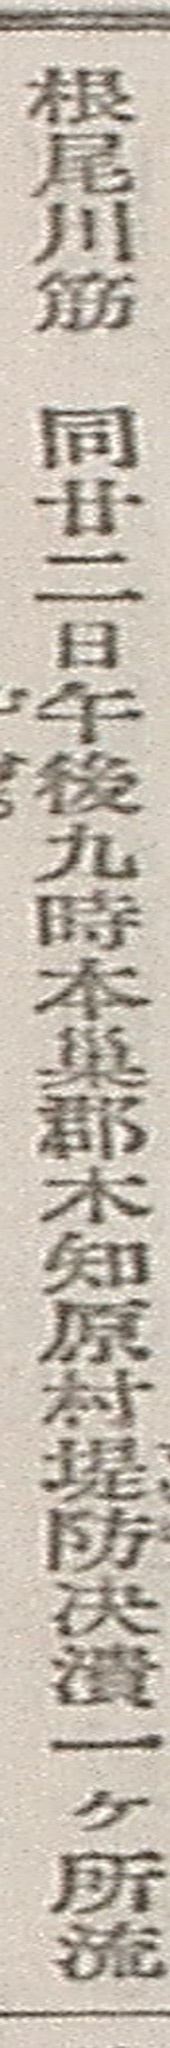根尾川筋同廿二日午後九時本巣郡木知原村堤防决潰一ヶ所流
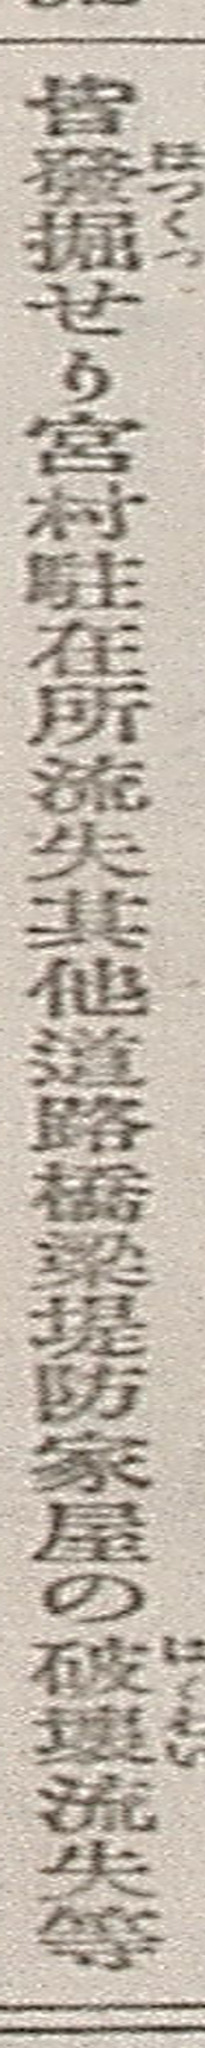皆発掘せり宮村駐在所流失其他道路橋梁堤防家屋の破壊流失等
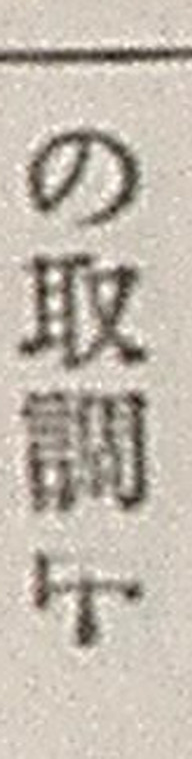の取調中
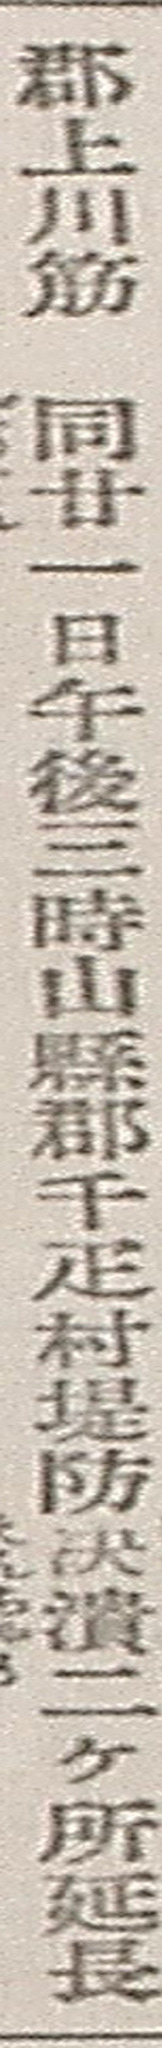郡上川筋同廿一日午後三時山縣郡千疋村堤防决潰二ヶ所延長
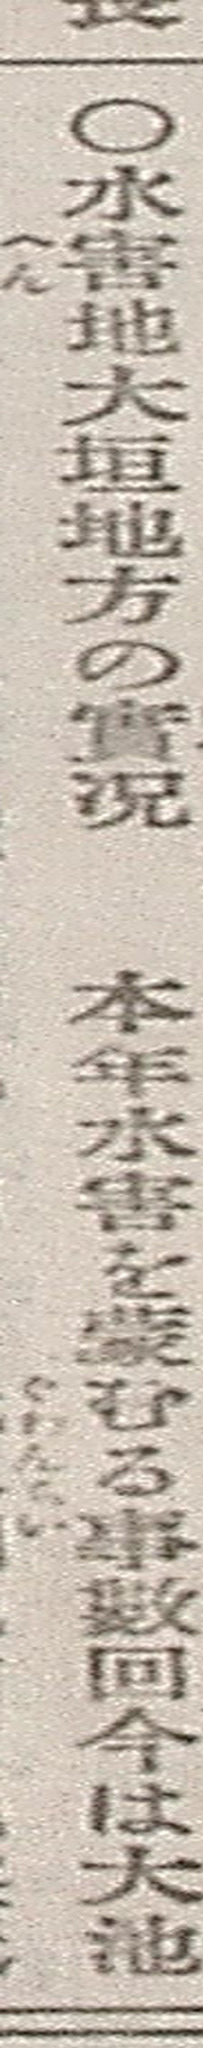◯水害地大垣地方の実況本年水害を蒙る事数回今は大池
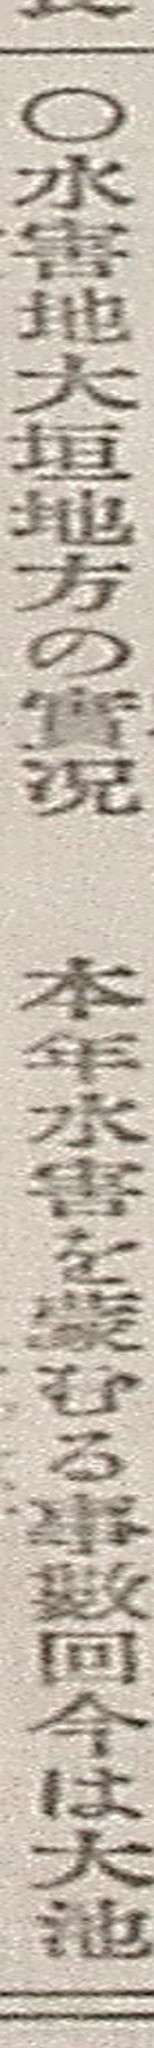◯水害地大垣地方の実況本年水害を蒙る事数回今は大池
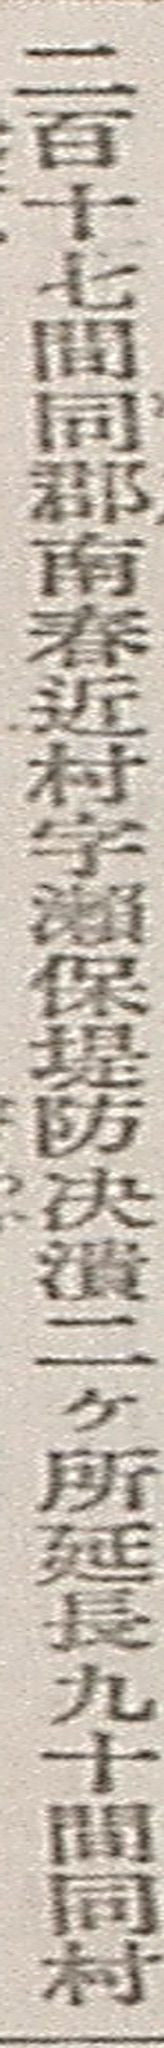二百十七間同郡南春近村字瀬保堤防决崩二ヶ所延長九十間同村
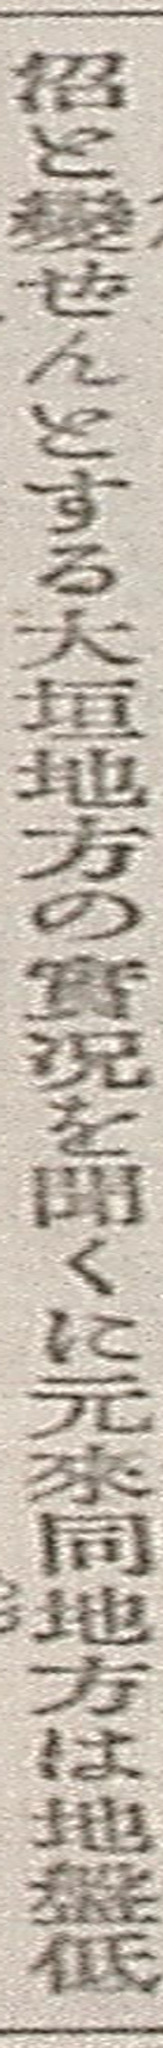沼と変ぜんとする大垣地方の実況を聞くに元来同地方は地盤低
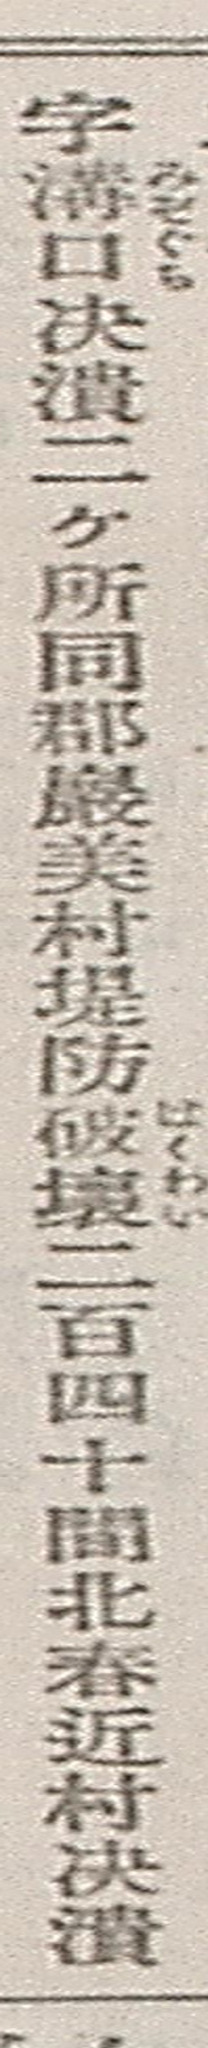字溝口决潰二ヶ所同郡巌美村堤防破壊二百四十間北春近村决潰
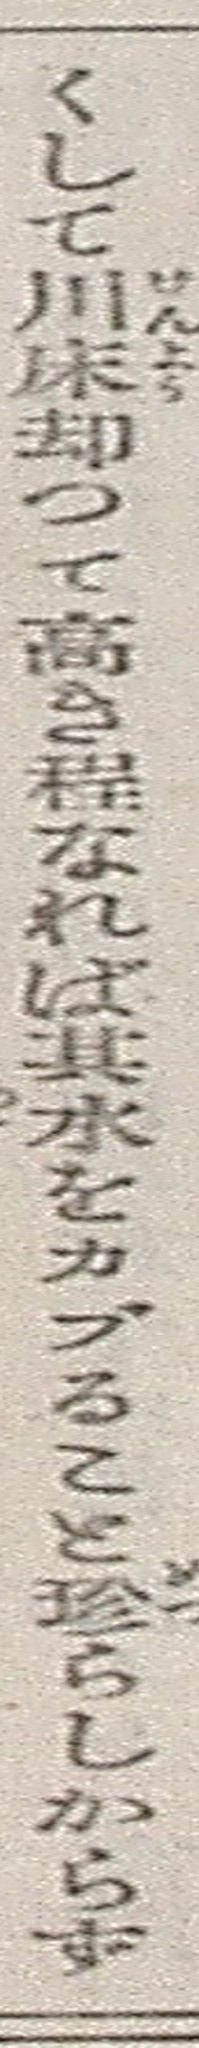くして川床却って高き程なれば其水をカブること珍らしからず
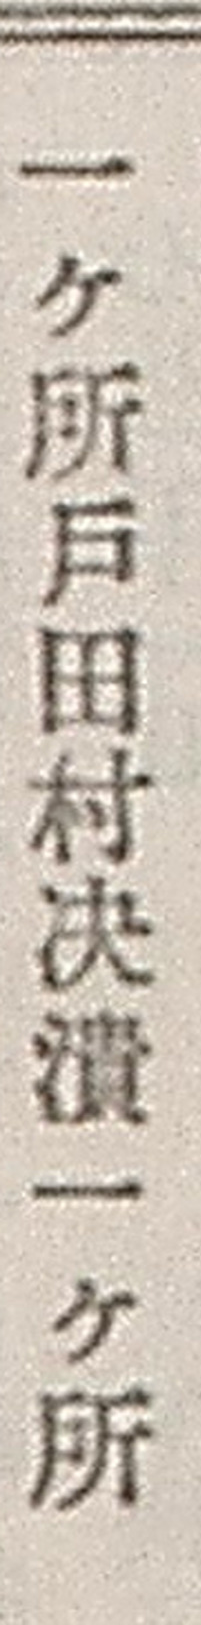一ヶ所戸田村决潰一ヶ所
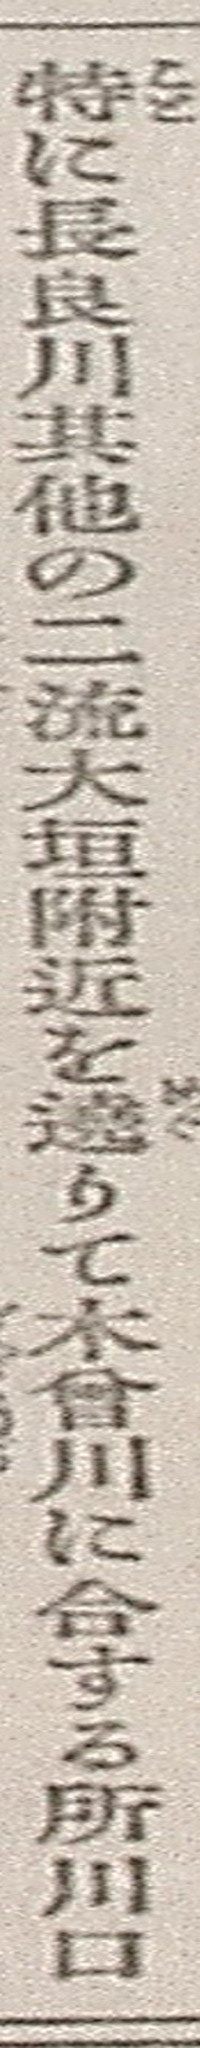殊に長良川其他の二流大垣附近を遶りて木曽川に合する所川口
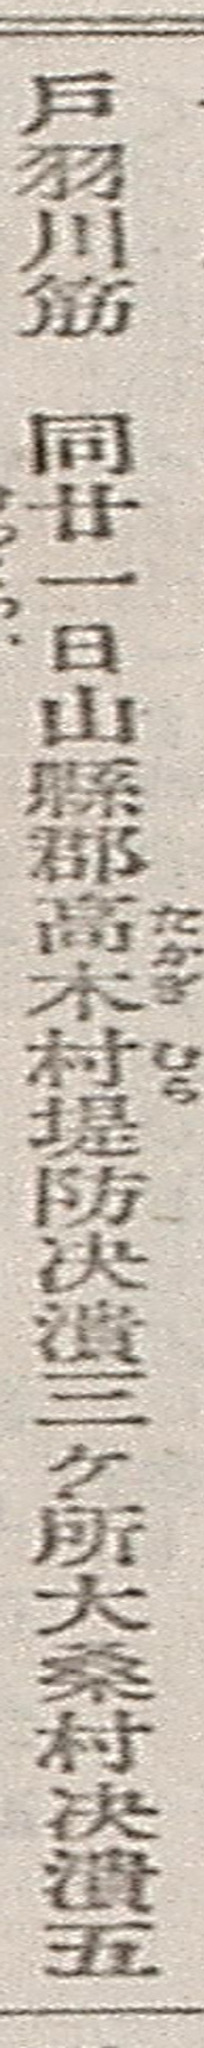戸羽川筋同廿一日山縣郡高木村堤防决潰三ヶ所大桑村决潰五
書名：風俗畫報臨時増刊第百二十六號　洪水被害録（中）
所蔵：東京大学地震研究所図書室 Earthquake Research Institute Library, The University of Tokyo, JAPAN
